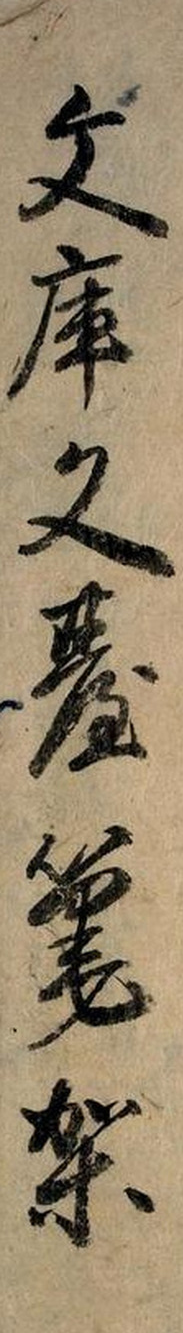文庫文台筆架
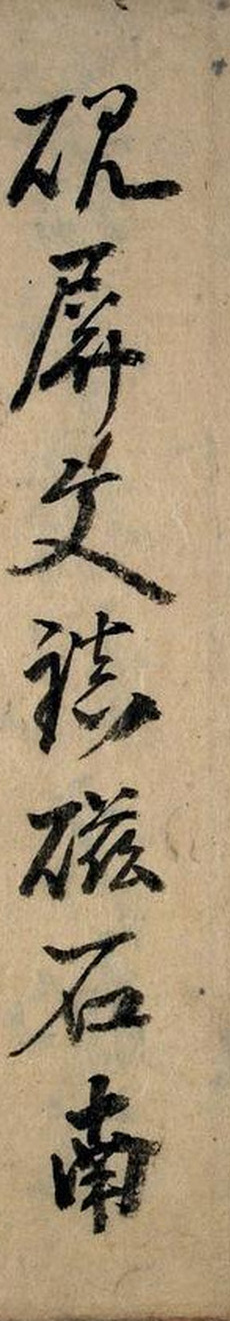硯屏文誌磁石南
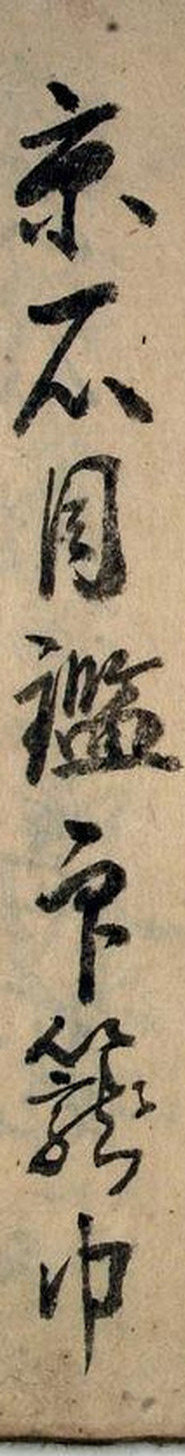京石目監印籠巾

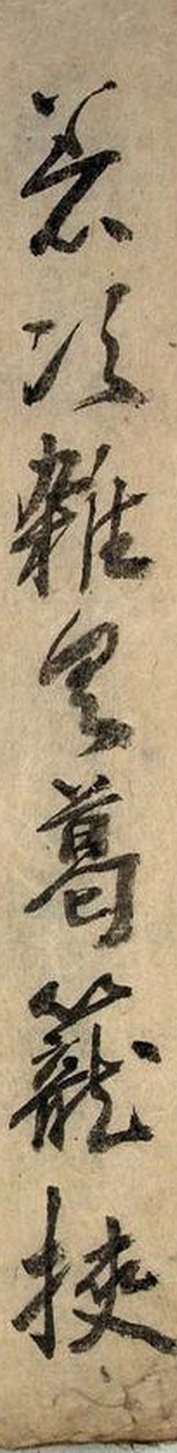着次雑具葛籠鋏
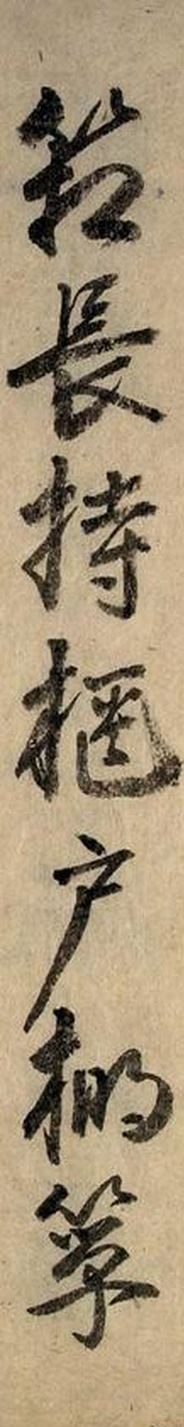箱長持框戸棚箪
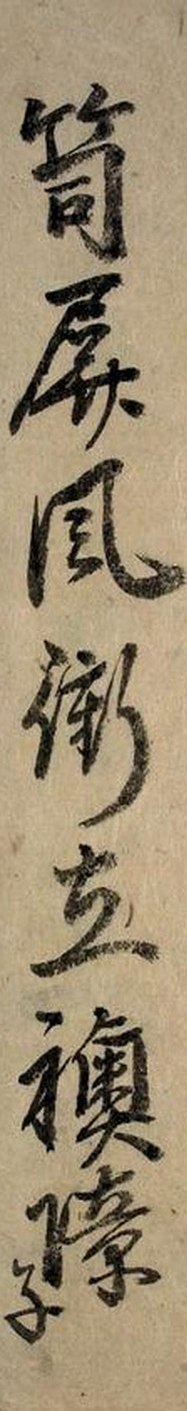笥屏風衝立襖障子
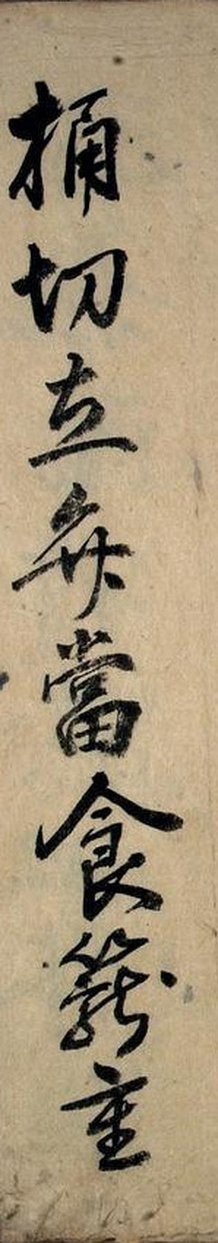桶切立弁当籠重

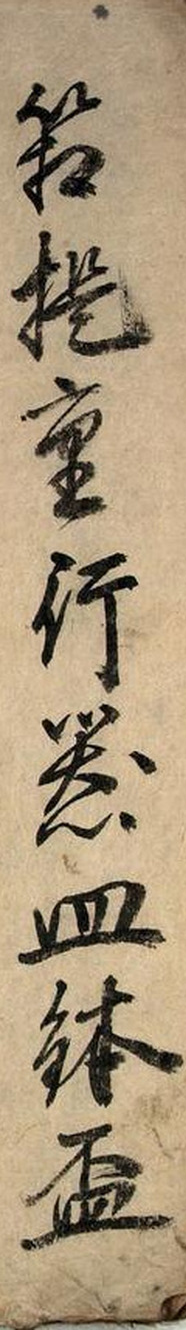箱提重行皿鉢盃
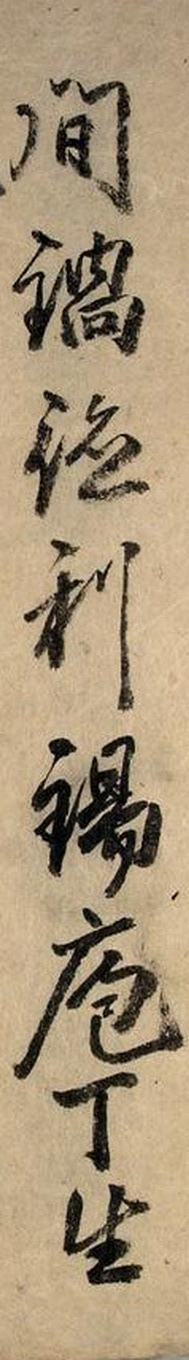間鍋徳利錫包丁生
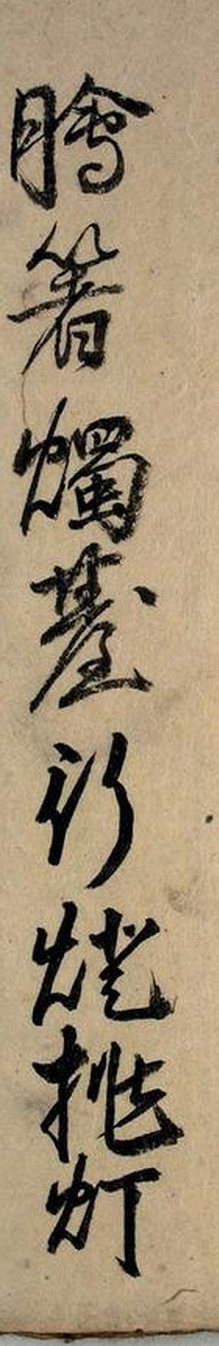膾箸燭台行燈提灯

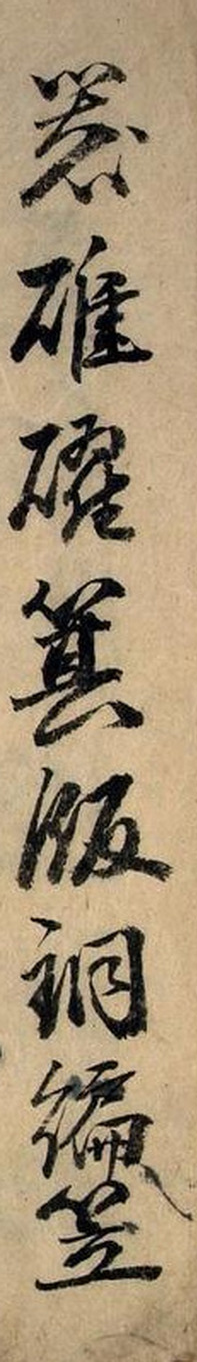器碓確箕飯銅編笠
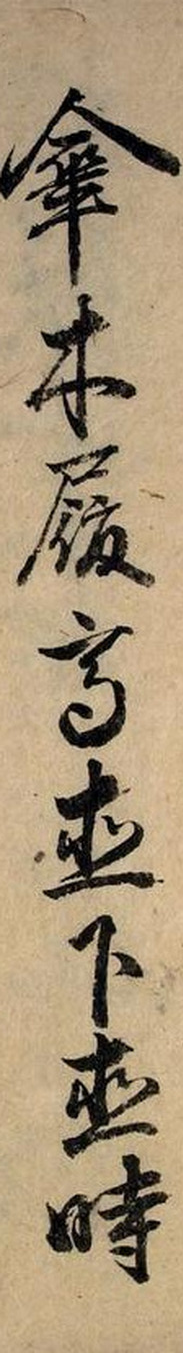傘木履高直下直時
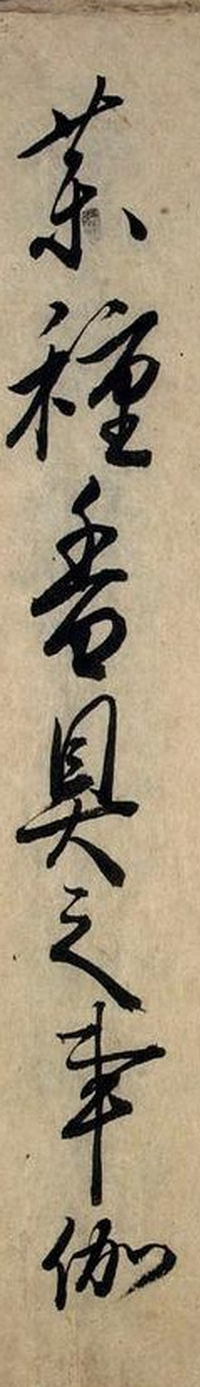菜種香具之事伽
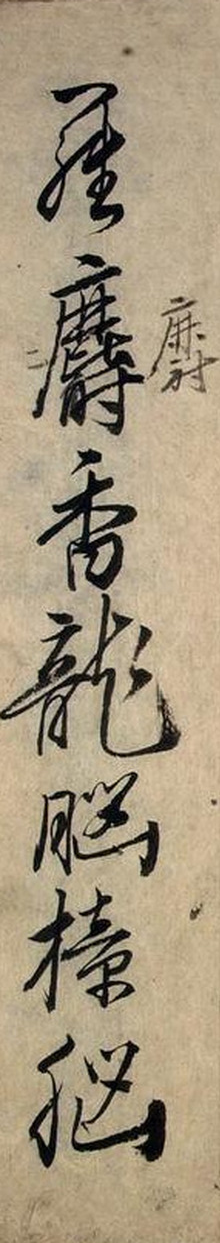罷麝香龍脳樟脳

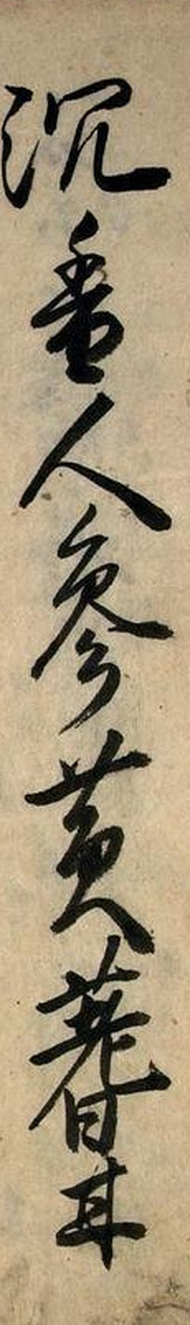沉香人参黄耆甘
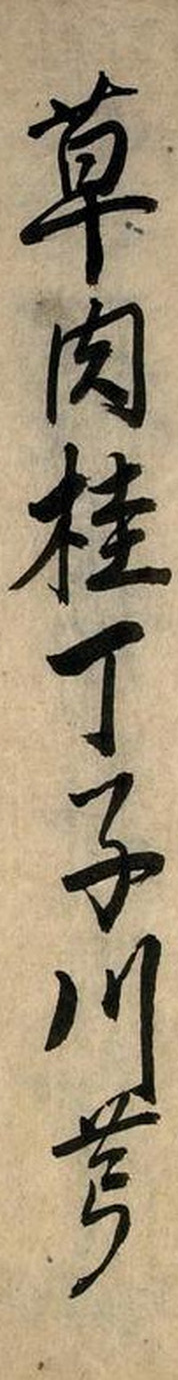草肉桂丁子川芎
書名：商売往来（往来物、手習）
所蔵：福井県文書館 Fukui Prefectural Archives
